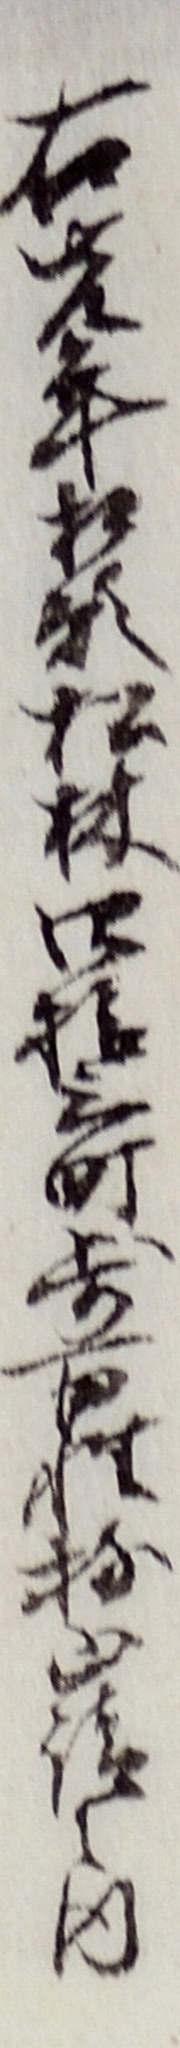右先年相願松林四拾三町歩百姓持山請之内
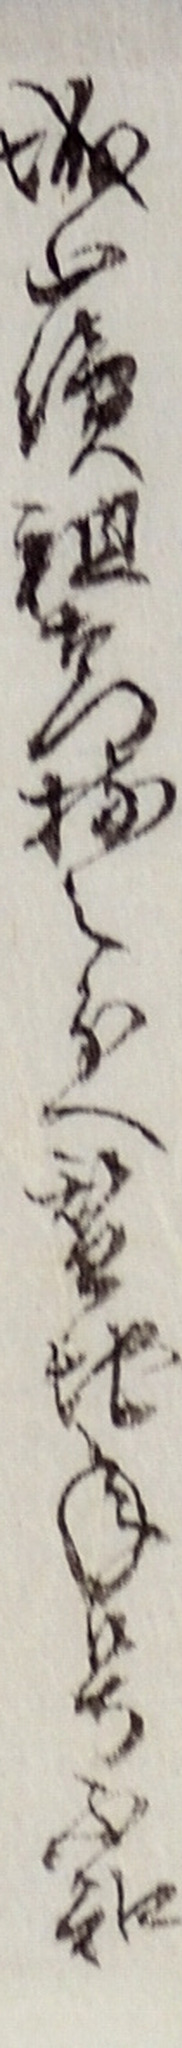城山続祖右衛門持之分へ替地年号不知
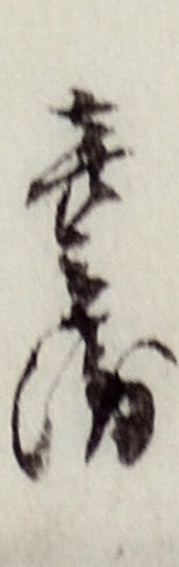喜兵衛
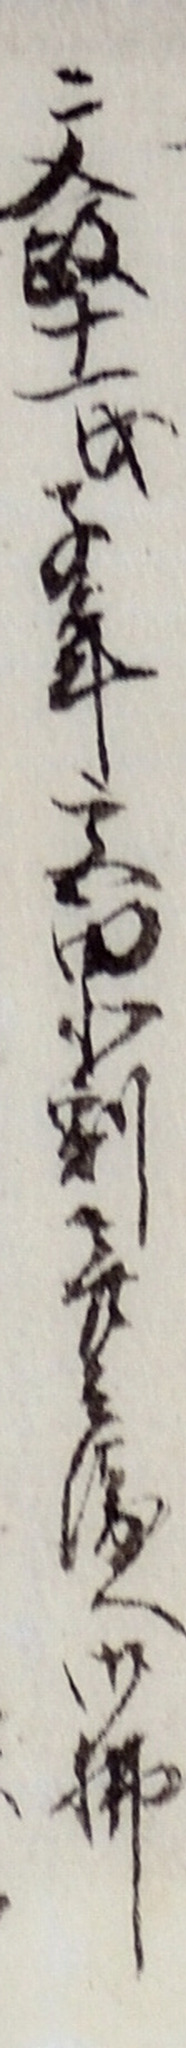文政十一戊子年宮田北割喜兵衛へ御払
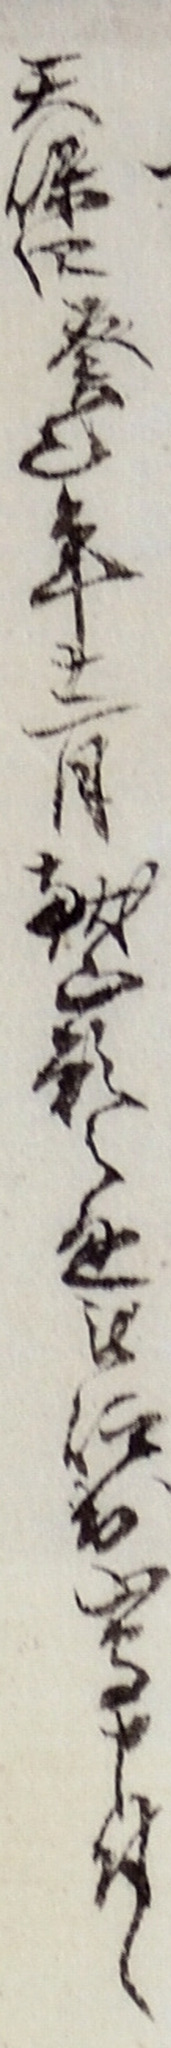天保四癸巳年十二月献山願之通被仰出山守申付候
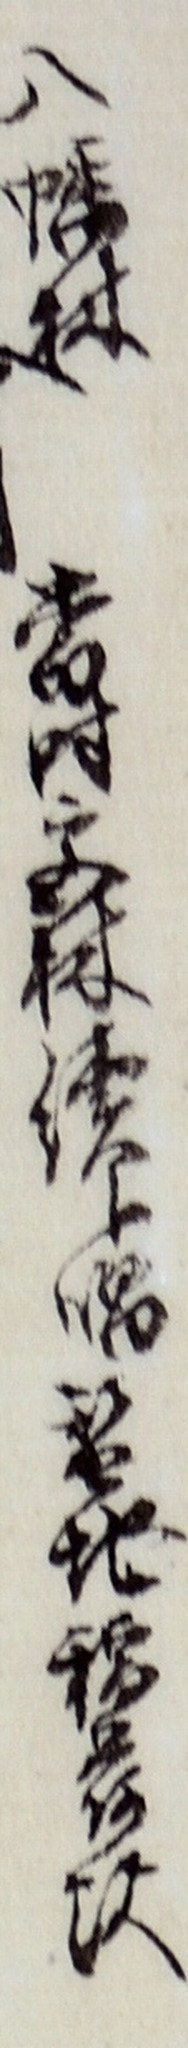八幡林当時宮林続ト唱替地稲荷沢
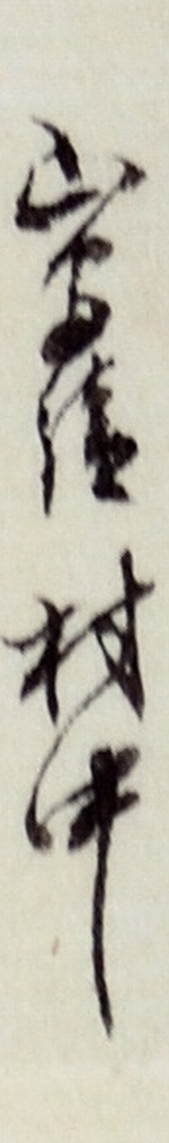山守請村中
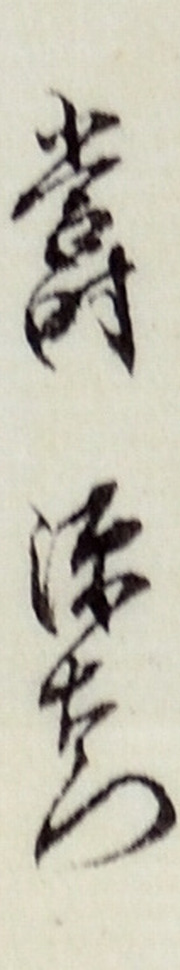当時源右衛門
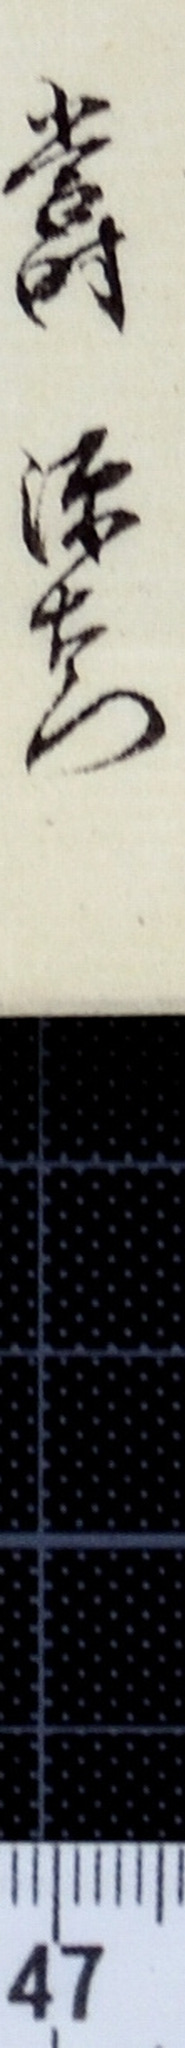当時源右衛門
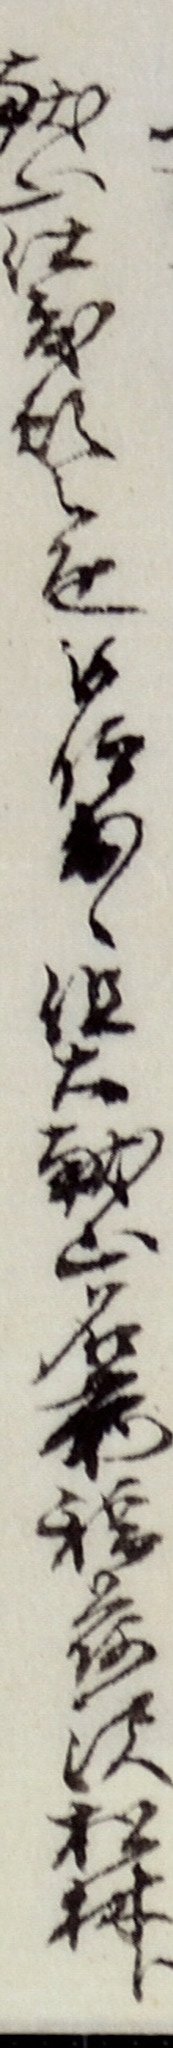献山仕度願之通被仰出候但右献山名前稲荷沢松林ト
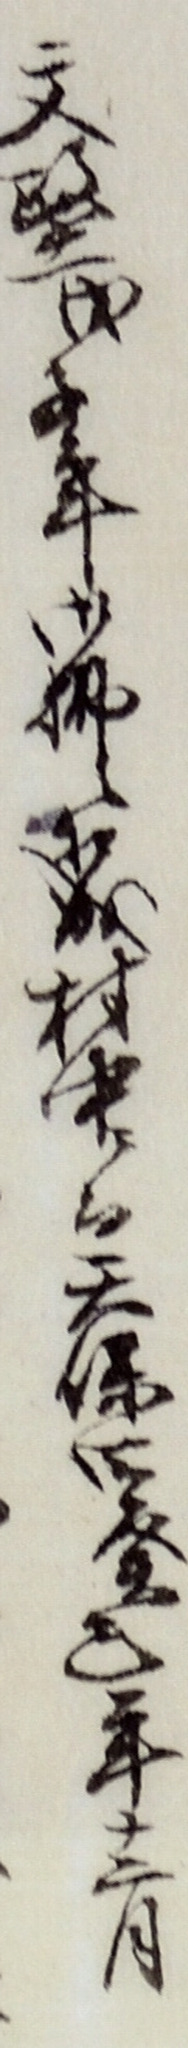文政十一戊子年御払ニ相成村中ニ而天保四癸巳年十二月
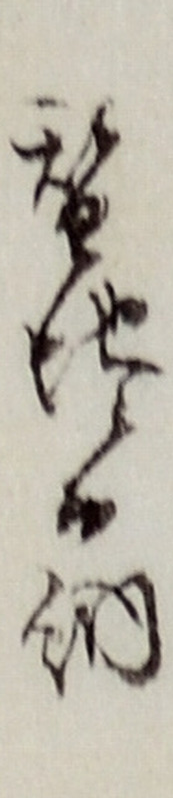替地二而納
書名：山林帳草稿
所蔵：伊那市立高遠町図書館・合同会社AMANE
